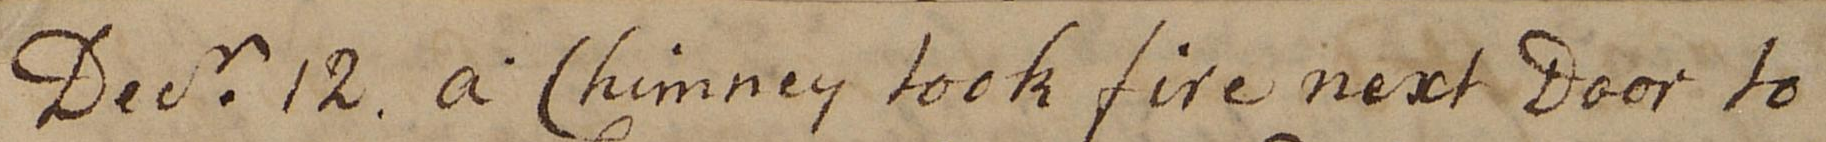Dec^r. 12. a Chimney took fire next Door to
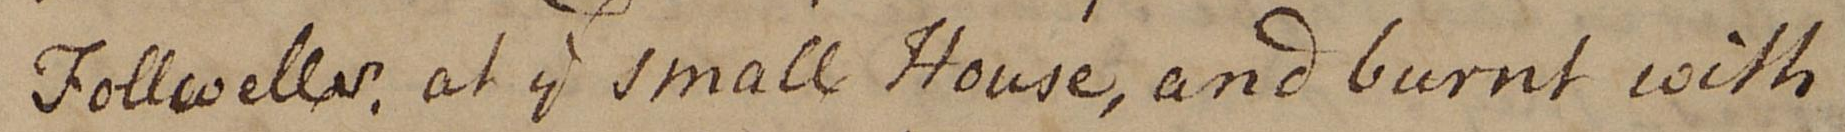Follweller, at y^e small House, and burnt with
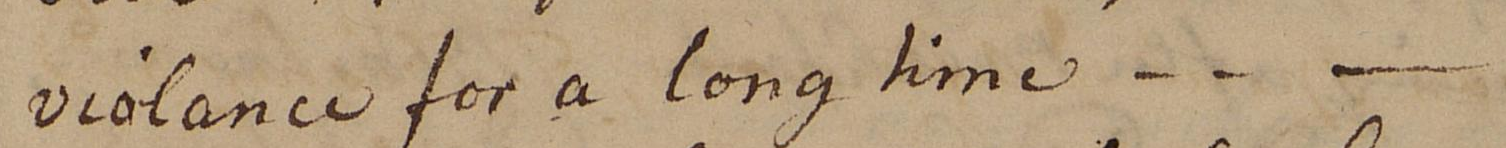violance for a long time-
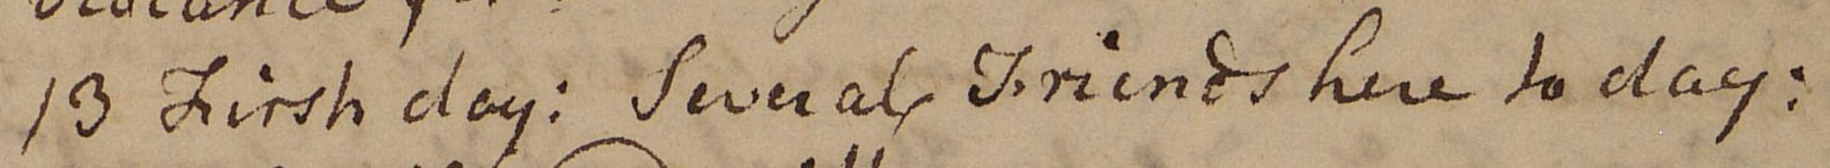13 First day: Several Friends here to day:
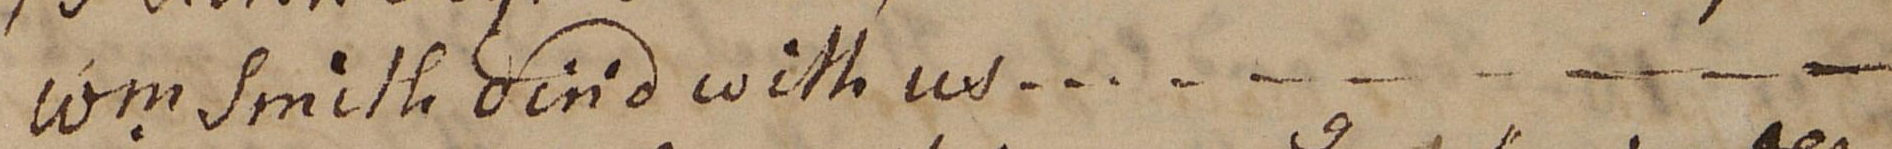W^m. Smith din'd with us---
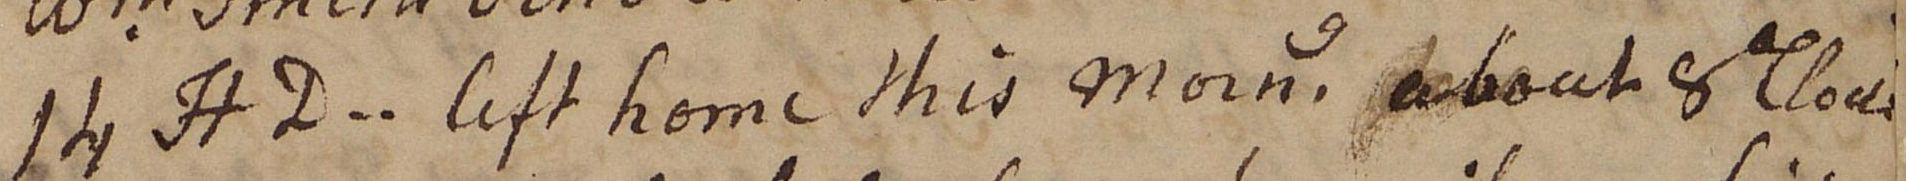14 HD-- left home this morn^g. about 8 ^oClock
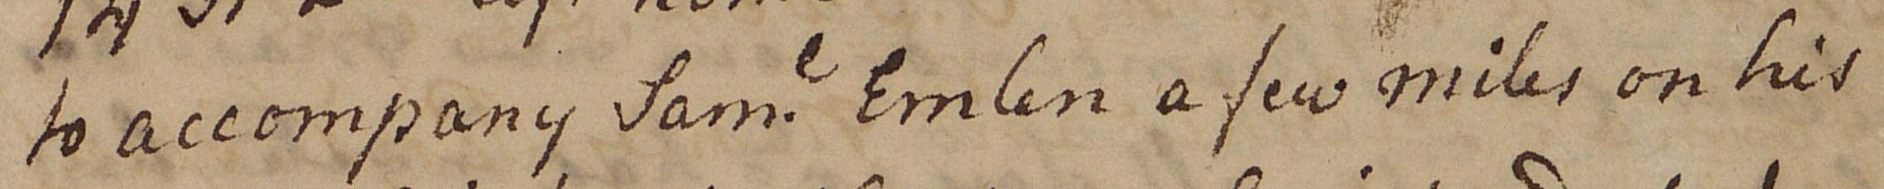to accompany Sam^l. Emlen a few miles on his
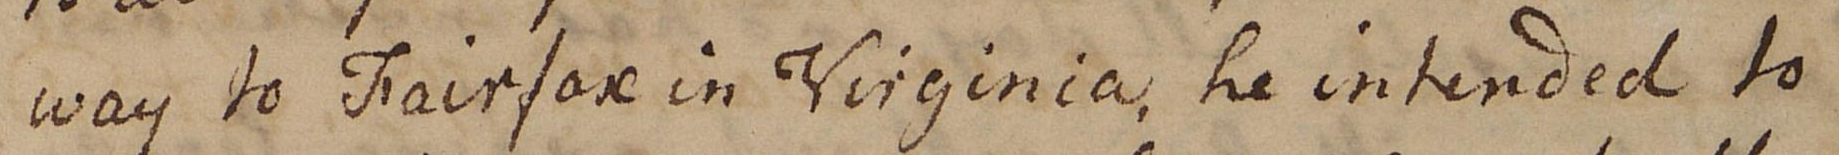way to Fairfax in Virginia, he intended to
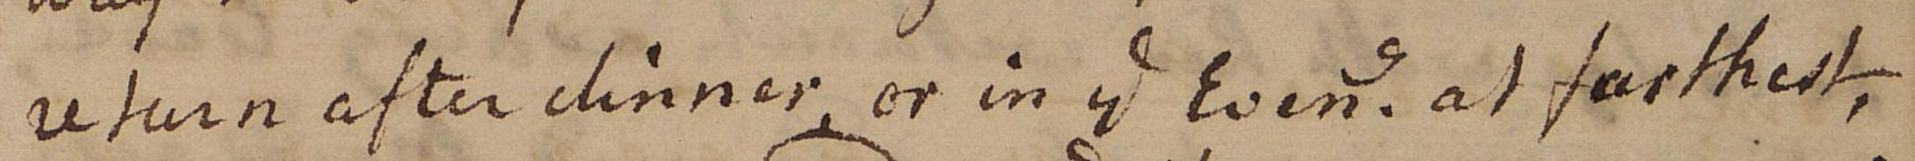return after dinner, or in y^e Even^g. at farthest,
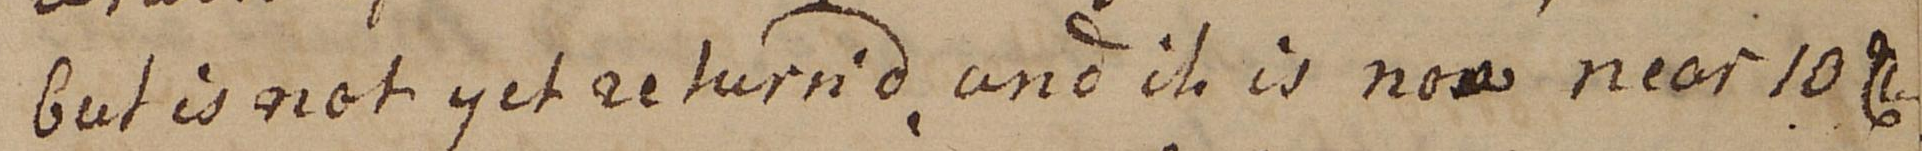but is not yet return'd, and it is now near 10 [^oCl]
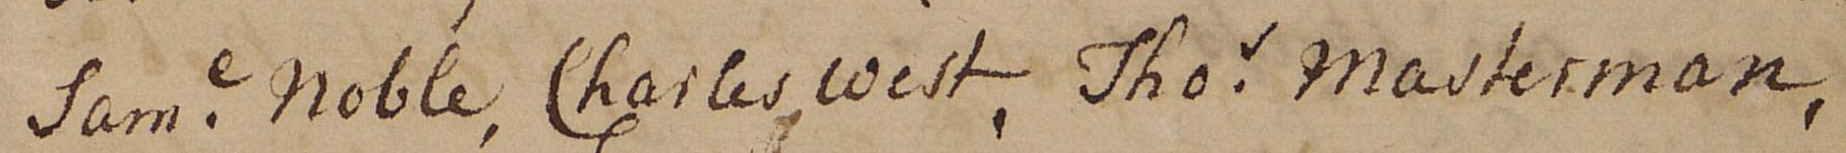Sam^l. Noble, Charles West, Tho^s. Masterman,
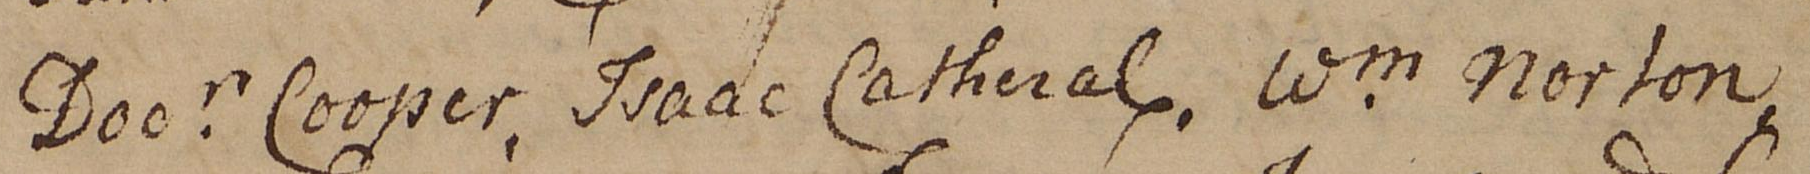Doc^r. Cooper, Isaac Catheral, W^m. Norton
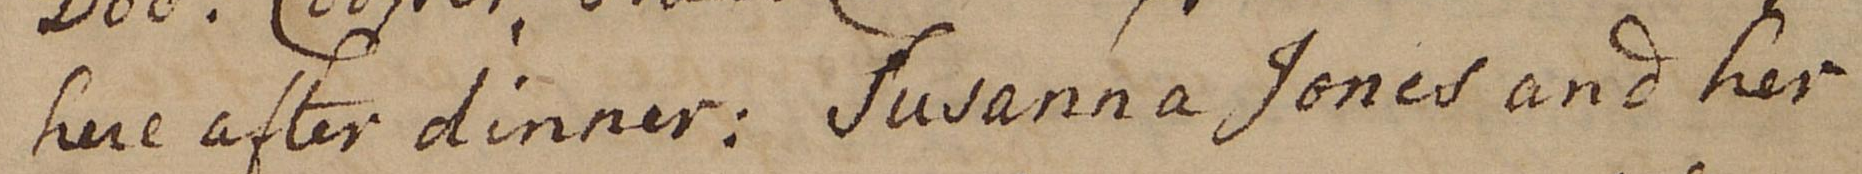here after dinner: Susanna Jones and her
